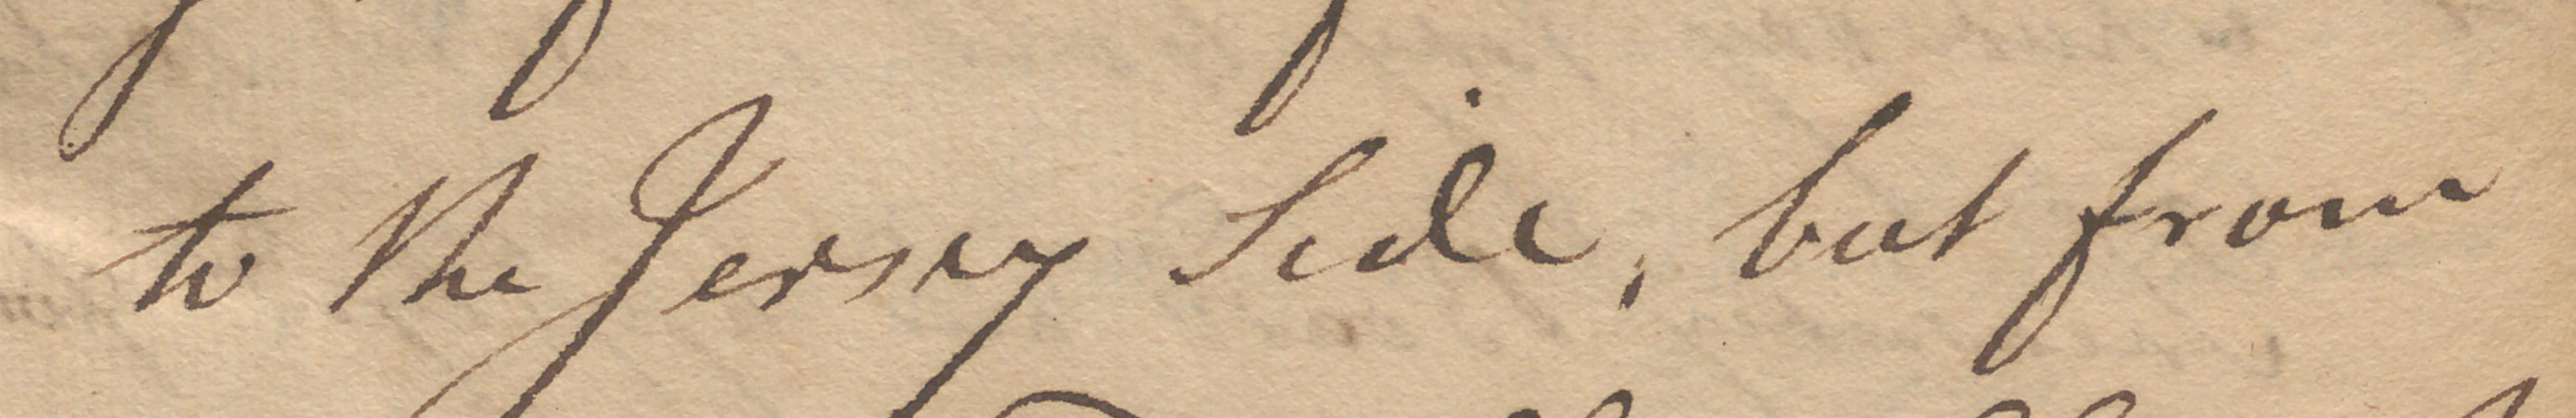to the Jersey Side, but from
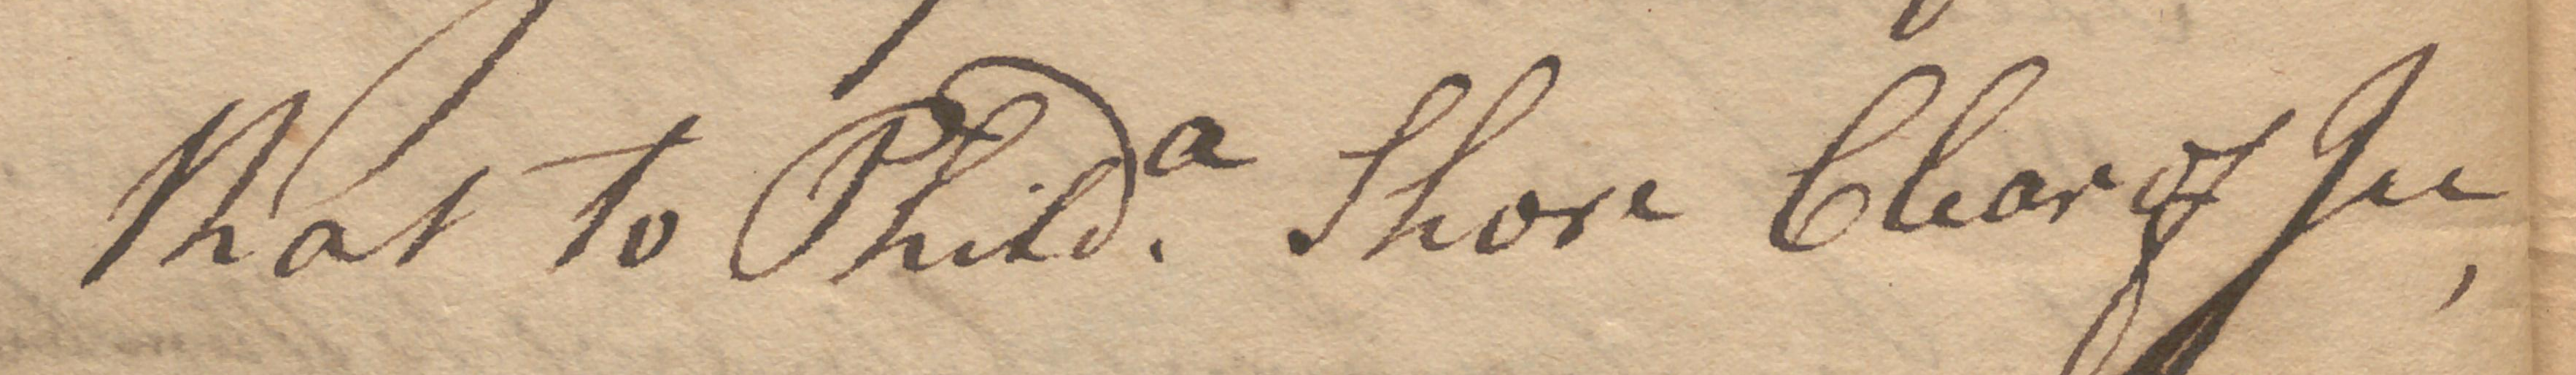that to Phild^a. Shore Clear of Ice
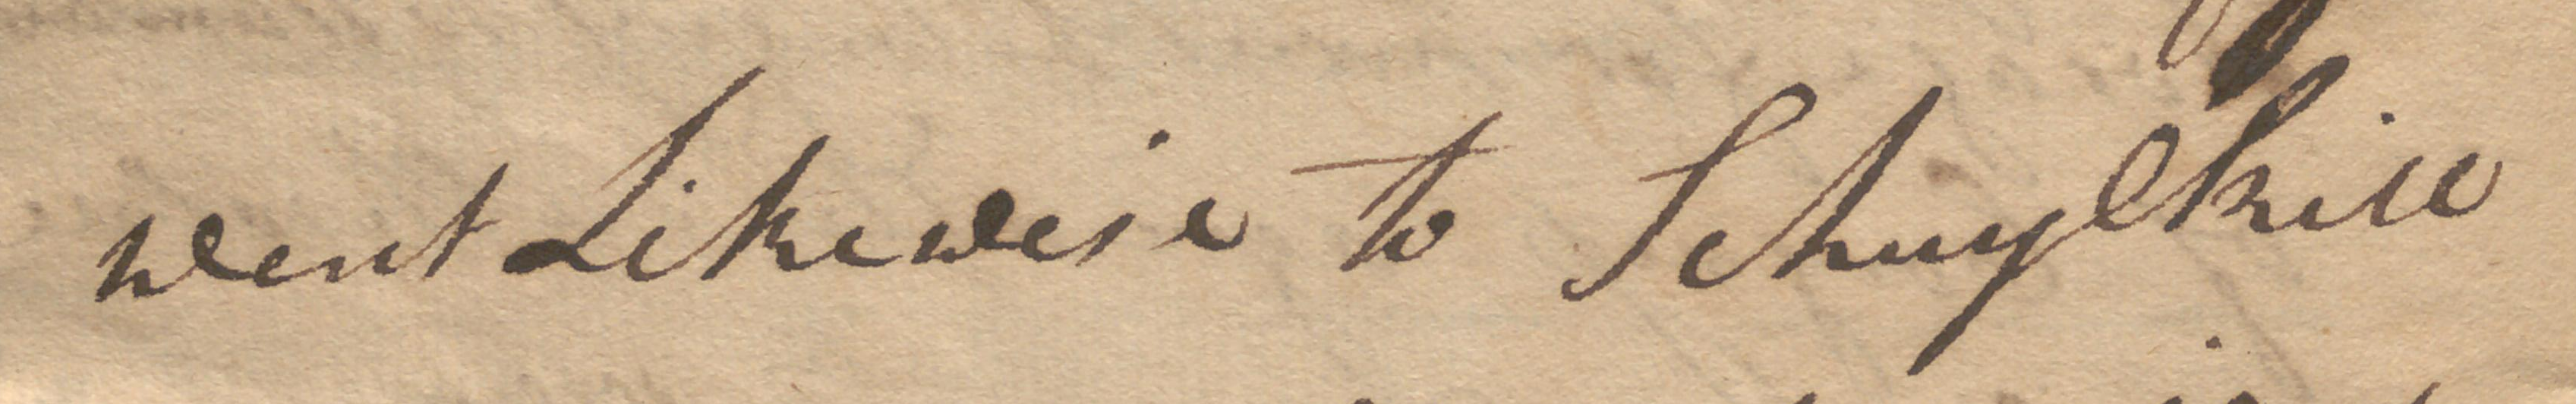went Likewise to Schuylkill
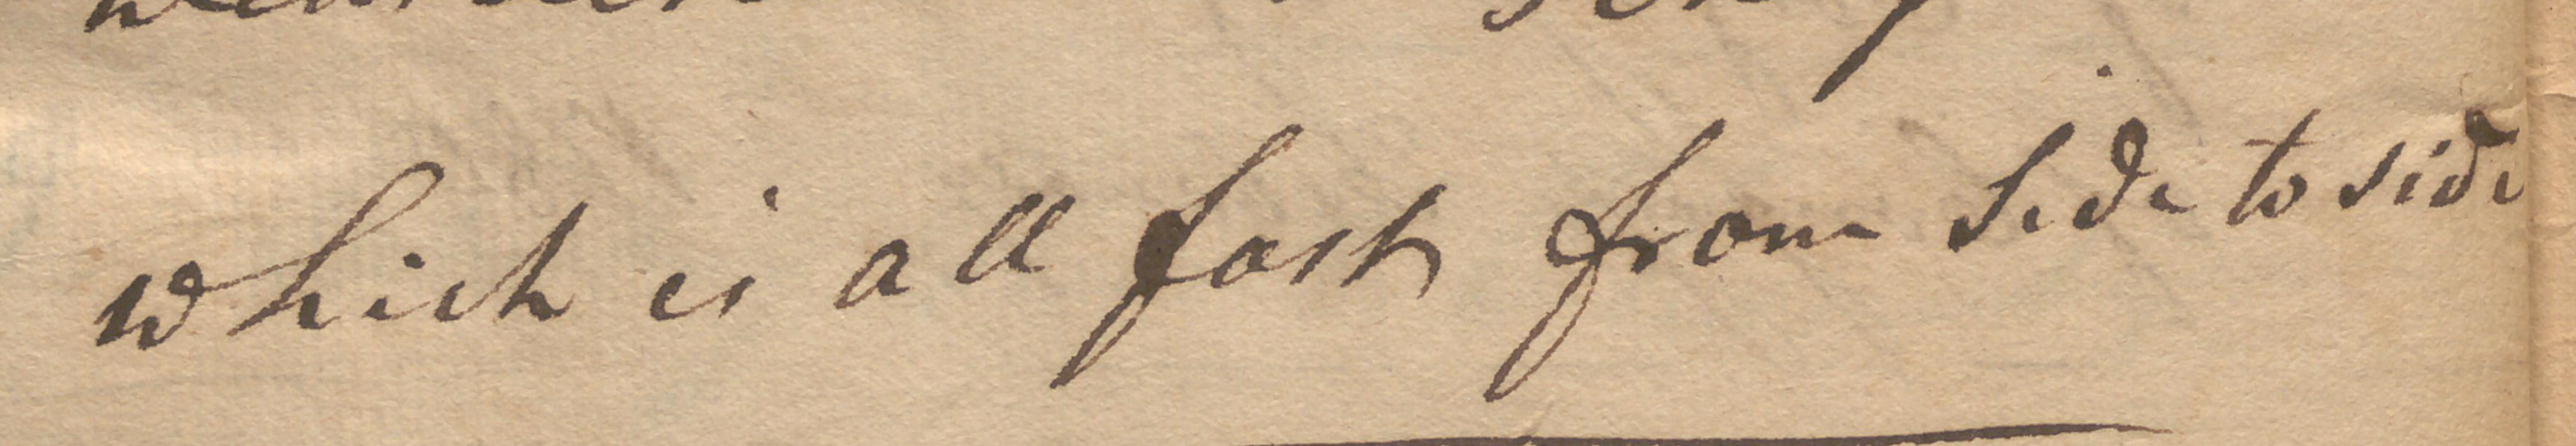which is all fast from side to side
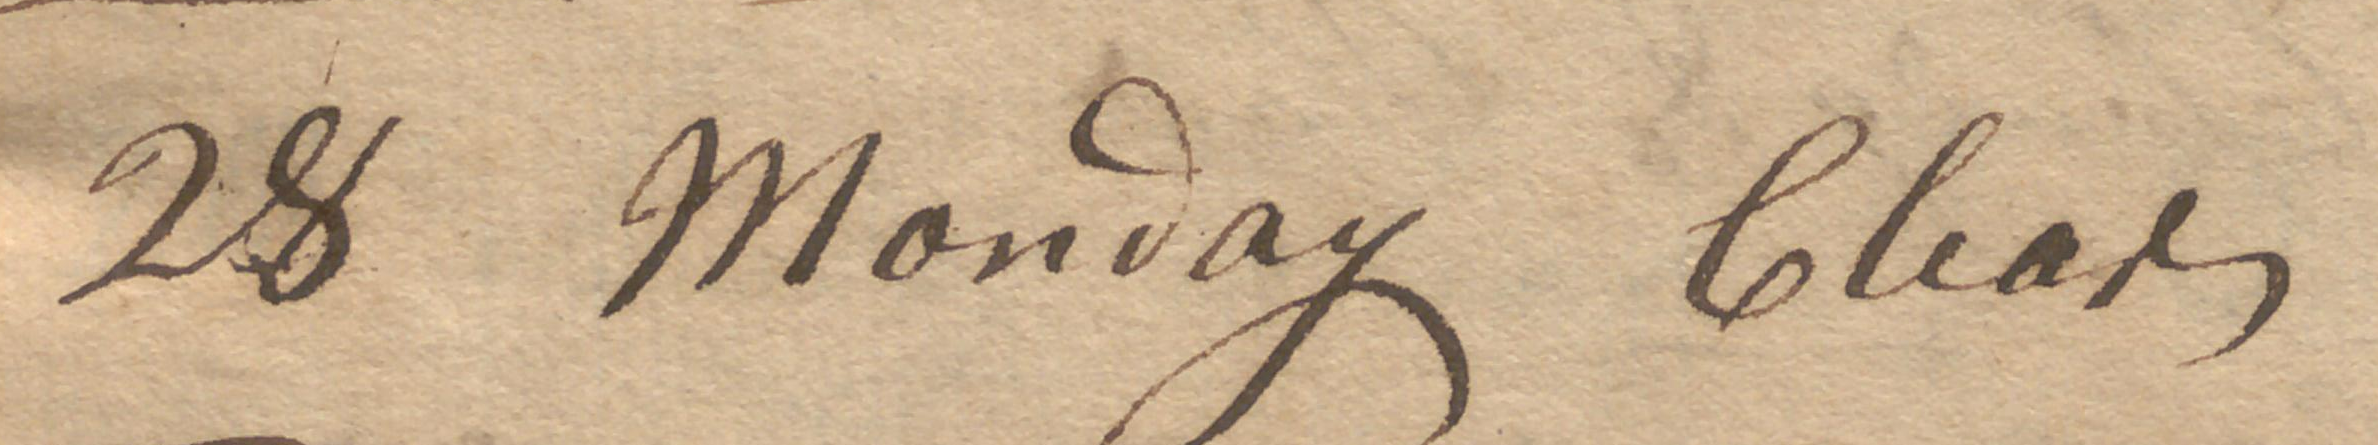28 Monday Clear
